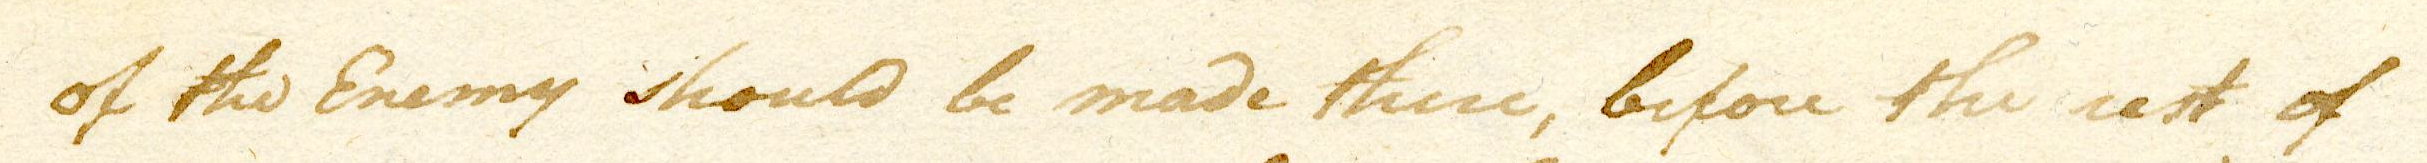of the Enemy should be made there, before the rest of
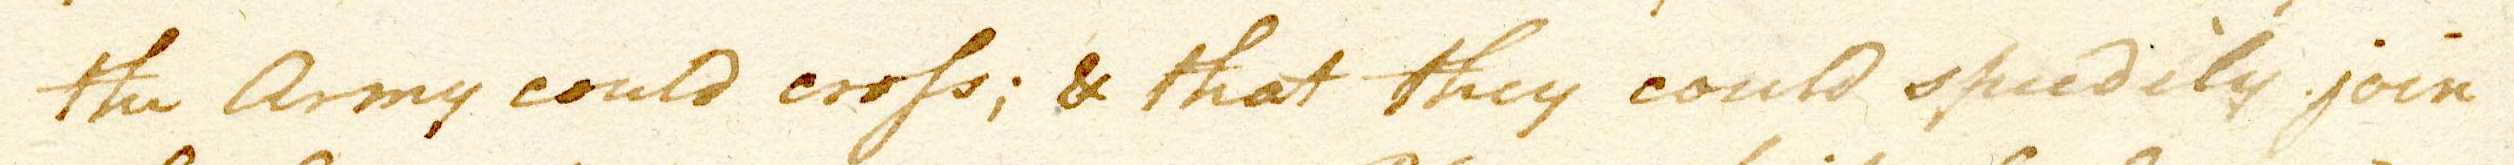the Army could cross; & that they could speedily join
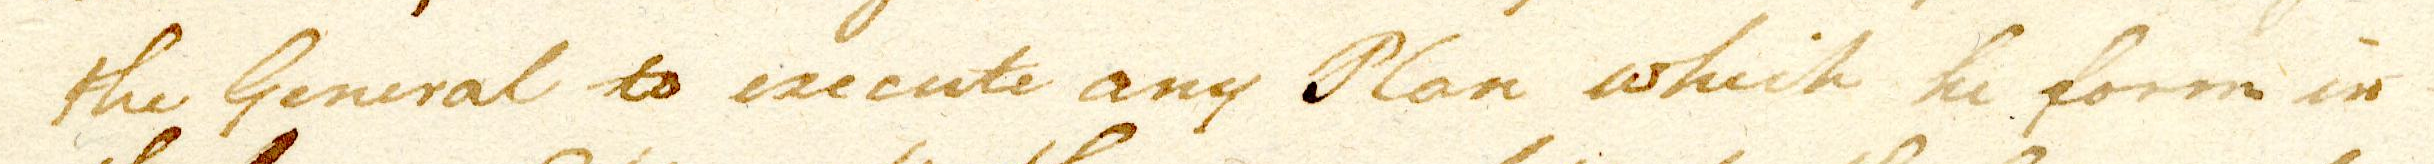the General to execute any Plan which he form in
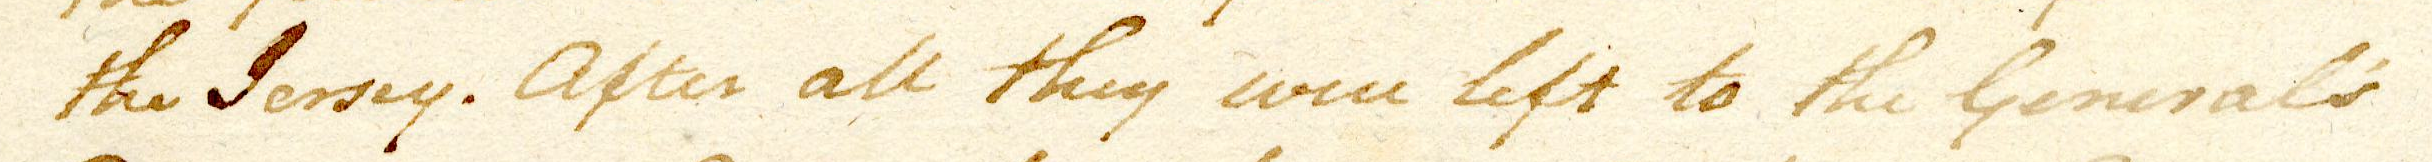the Jersey. After all they were left to the General's
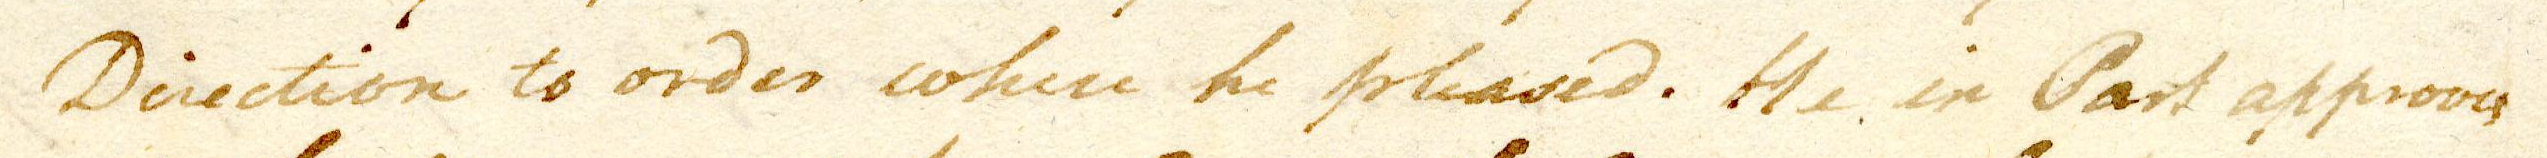Direction to order where he pleased. He in Part approves
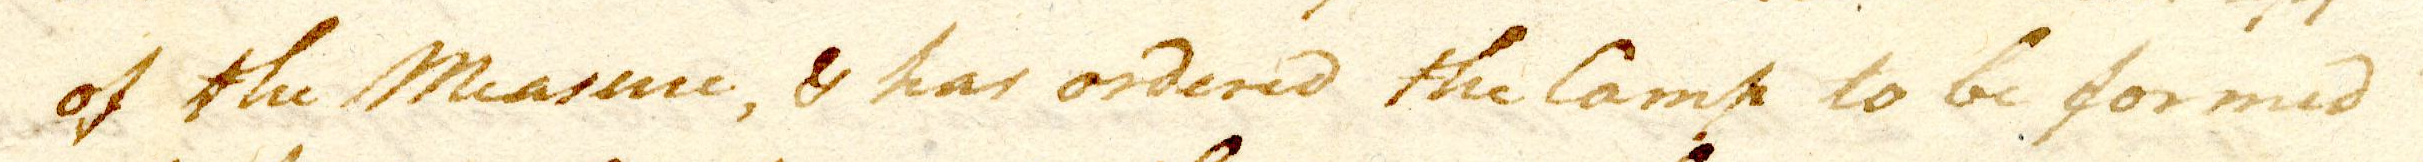of the Measure, & has ordered the Camp to be formed
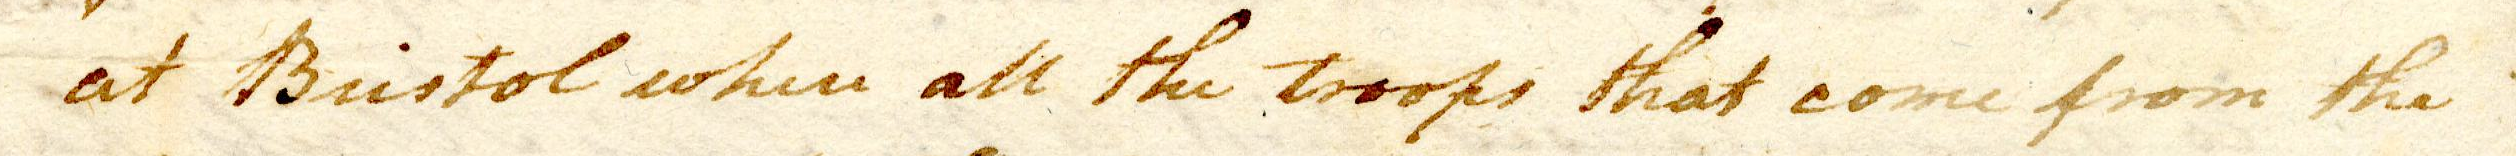at Bristol where all the troops that come from the
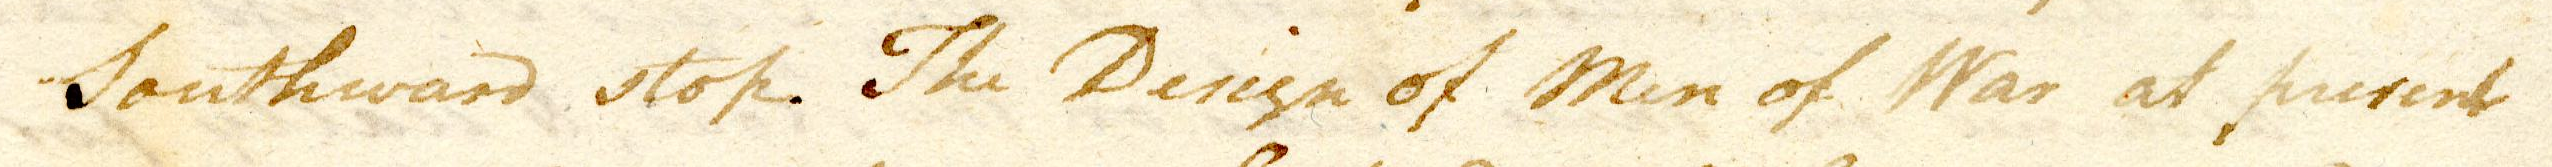Southward stop. The Design of Men of War at present
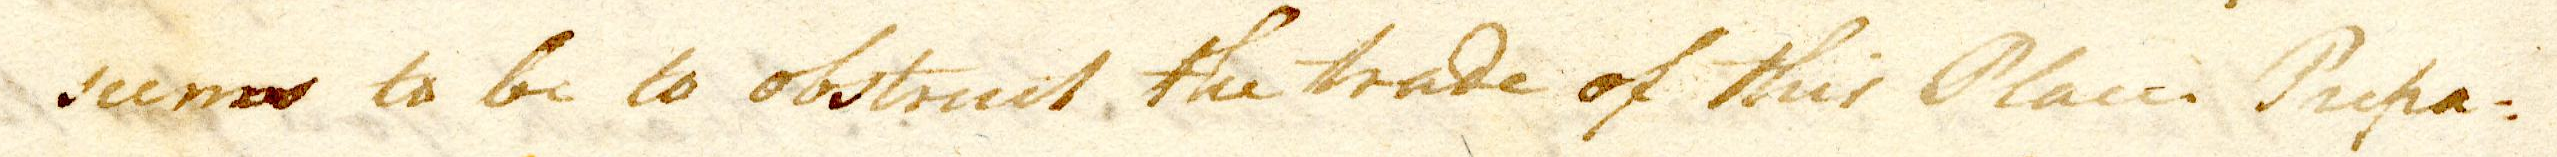seems to be to obstruct the trade of this Place. Prepa-
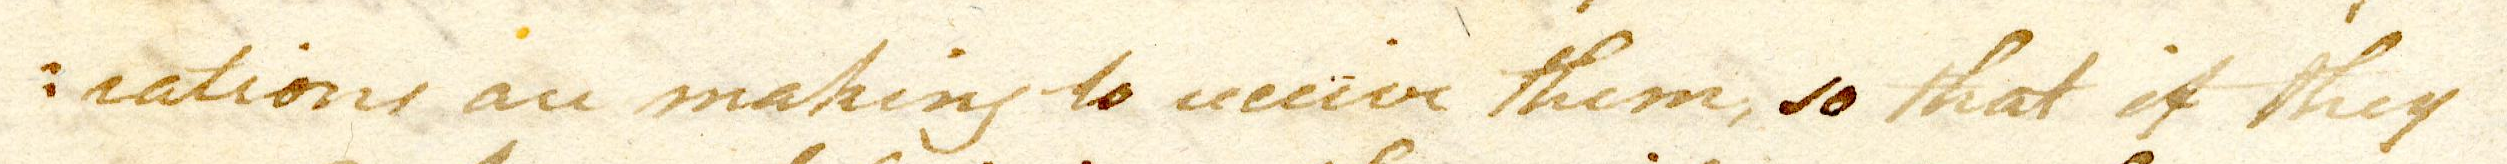-rations are making to receive them, so that if they
